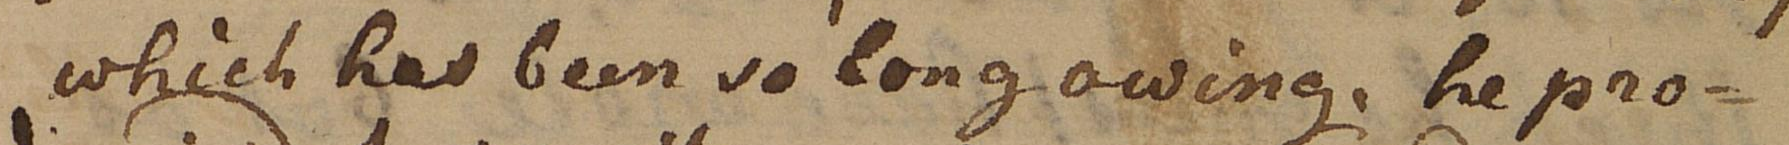which has been so long owing. he pro-
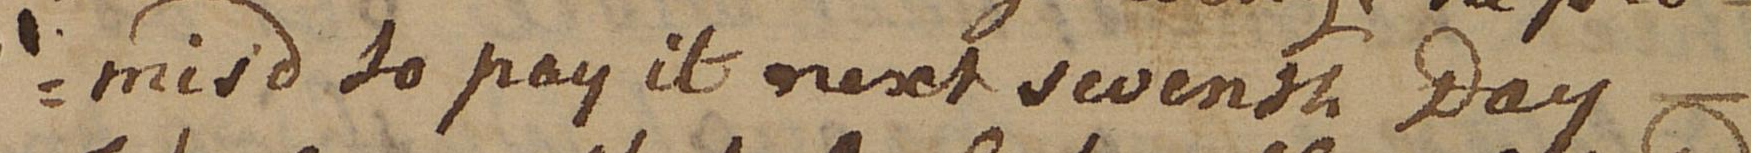-mis'd to pay it next seventh Day-
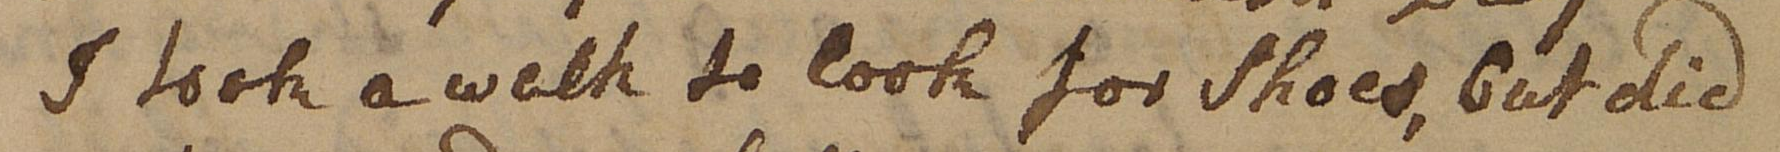I took a walk to look for Shoes, but did
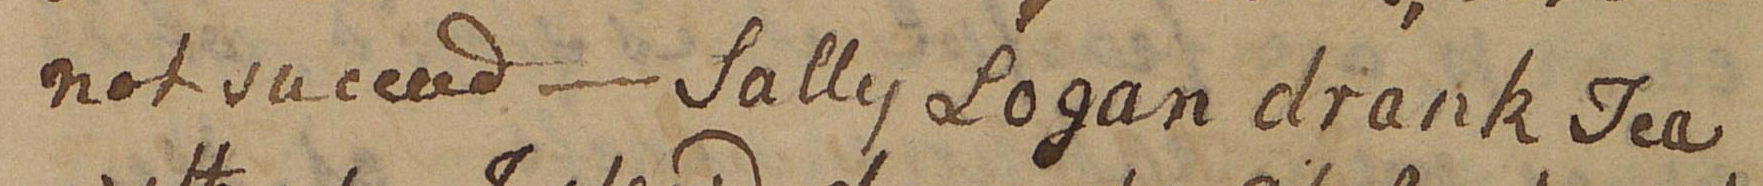not succeed- Sally Logan drank Tea
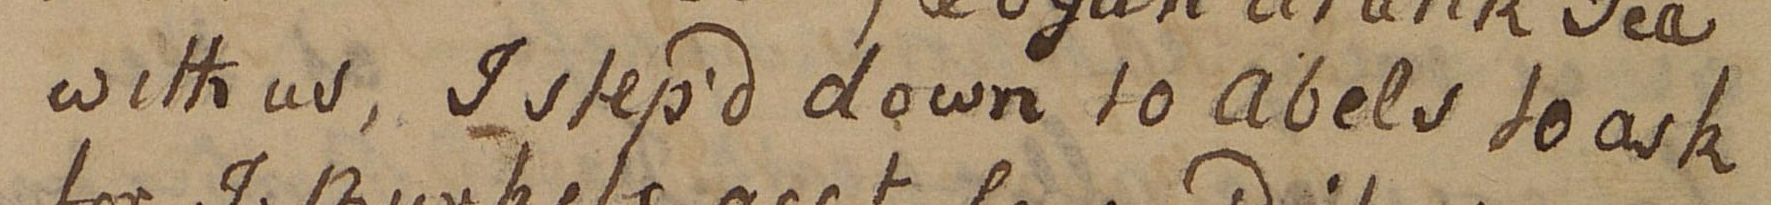with us, I step'd down to Abels to ask
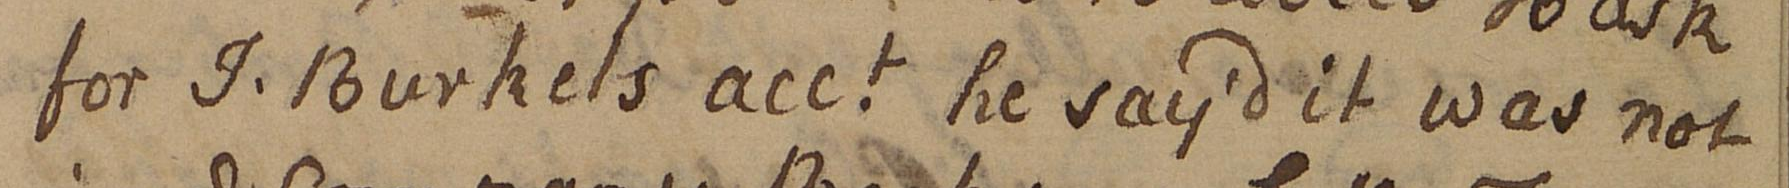for J. Burkets acc^t. he say'd it was not
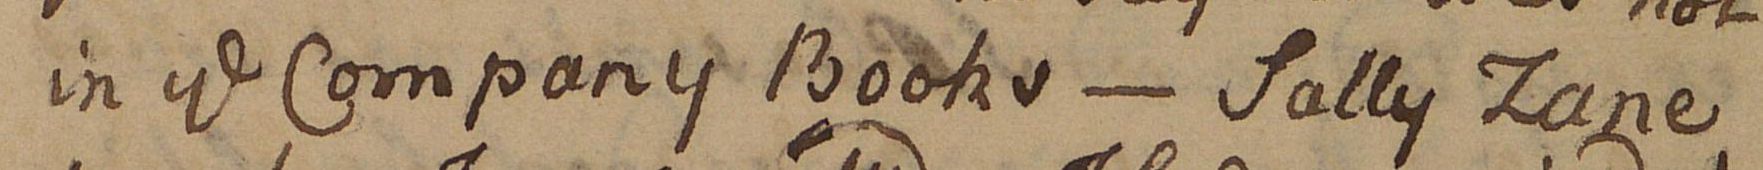in y^e Company Books- Sally Zane
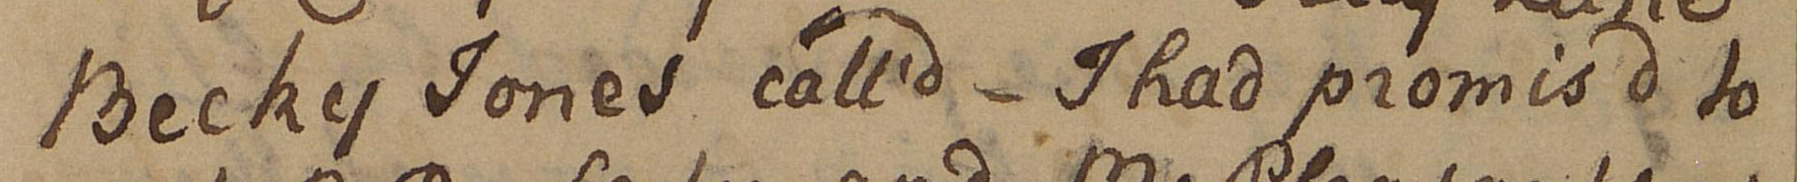Becky Jones call'd- I had promisd to
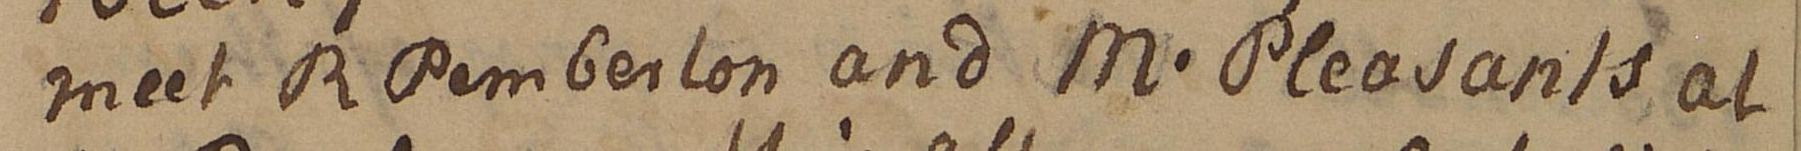meet R Pemberton and M. Pleasants at
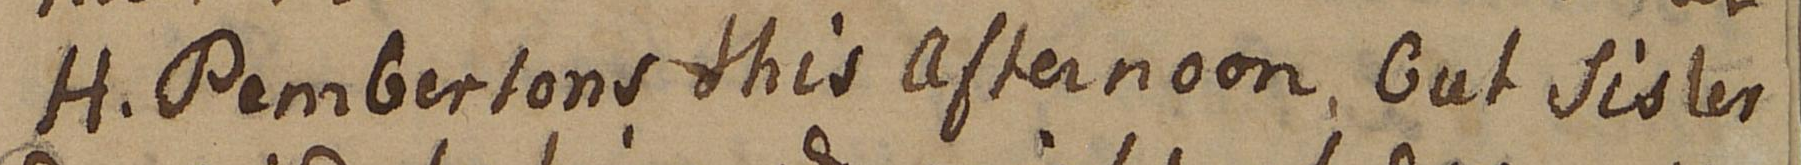H. Pembertons This afternoon, but Sister
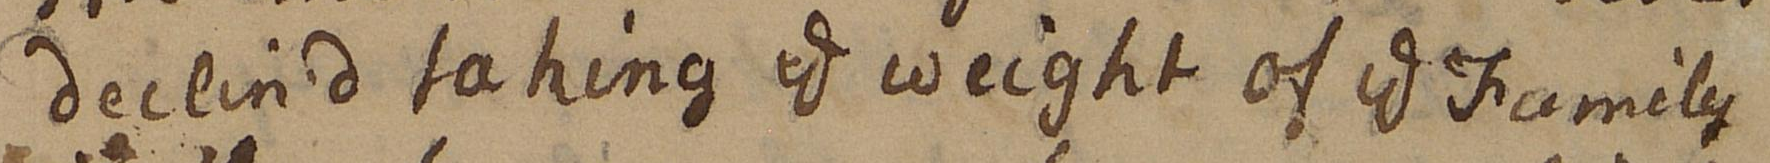declin'd taking y^e weight of y^e Family
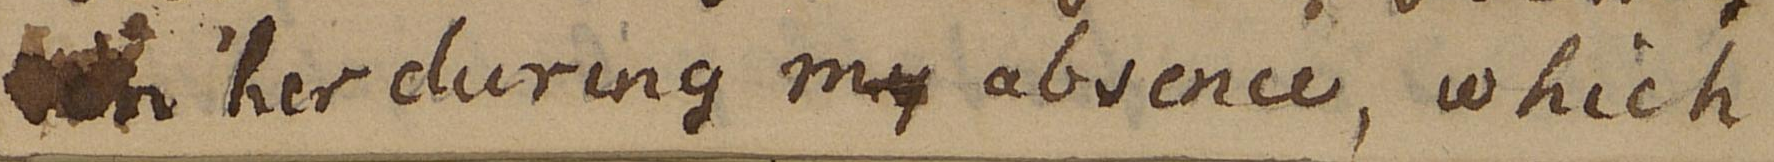[___] her during my absence, which
